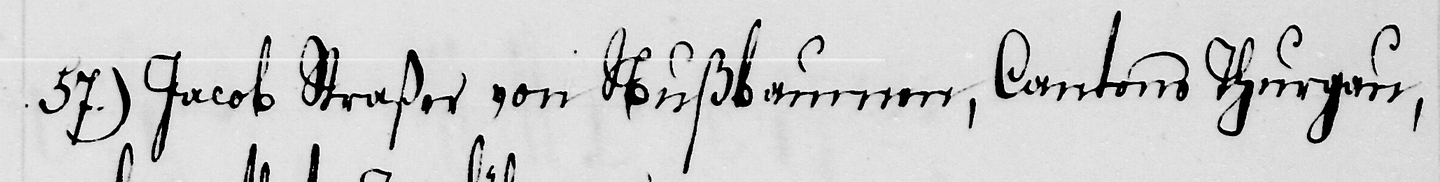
57.) Jacob Straßer von Nußbaumen, Cantons Thurgau,
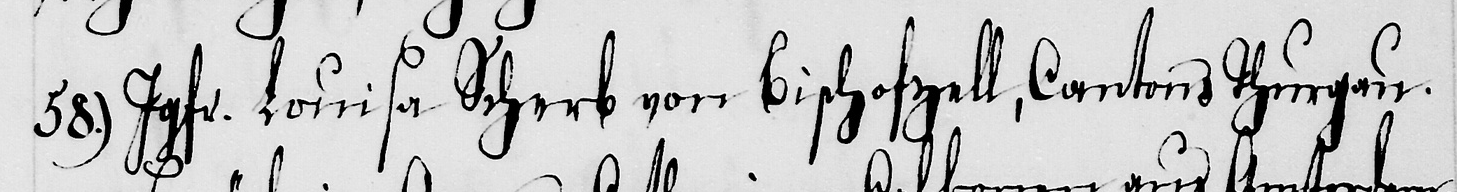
58.) Jgfr. Louisa Scherb von Bischofzell, Cantons Thurgau.
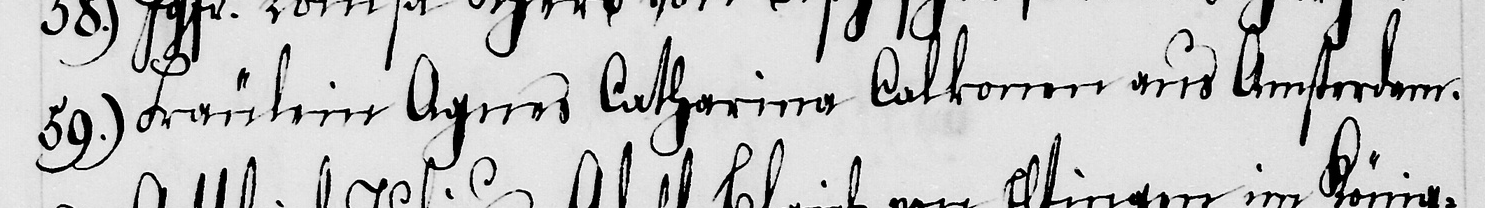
59.) Fräulein Agnes Catharina Calkonen aus Amsterdam.
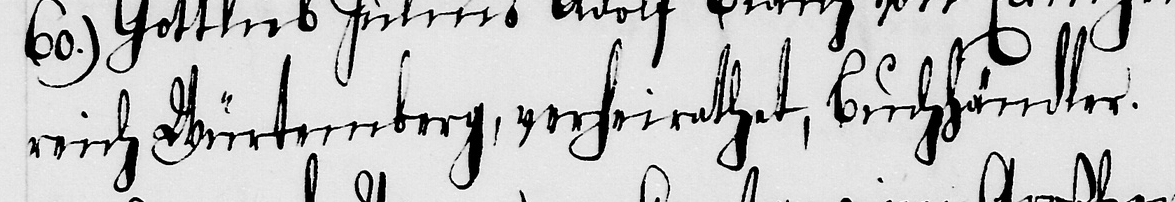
reich Würtemberg, verheirathet, Buchhändler.
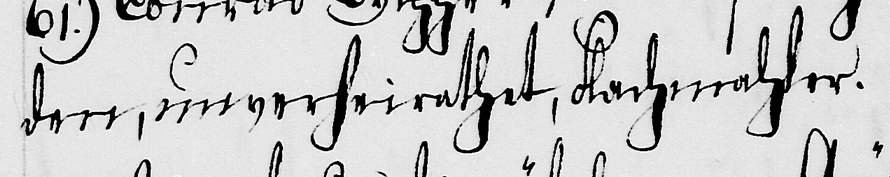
den, unverheirathet, Flachmahler.
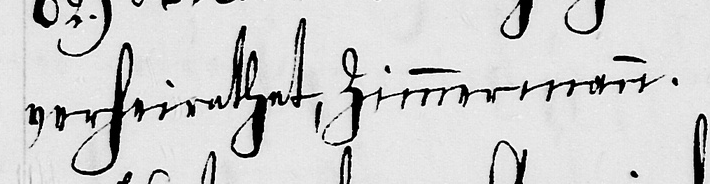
verheirathet, Zimmermann.
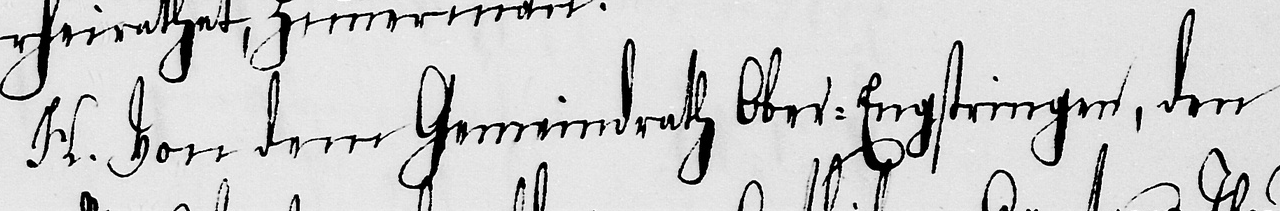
H. Von dem Gemeindrath Ober-Engstringen, den
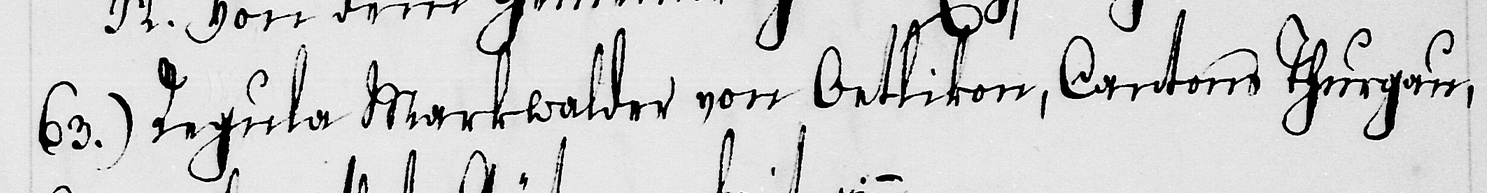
63.) Regula Markwalder von Oetlikon, Cantons Thurgau,
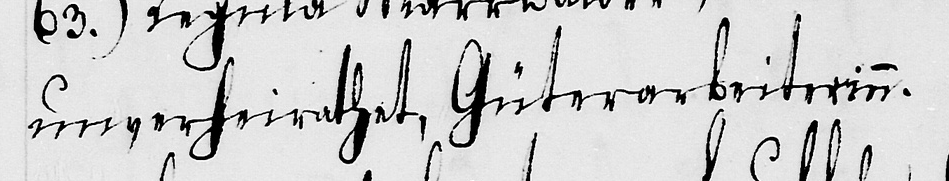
unverheirathet, Güterarbeiterinn.
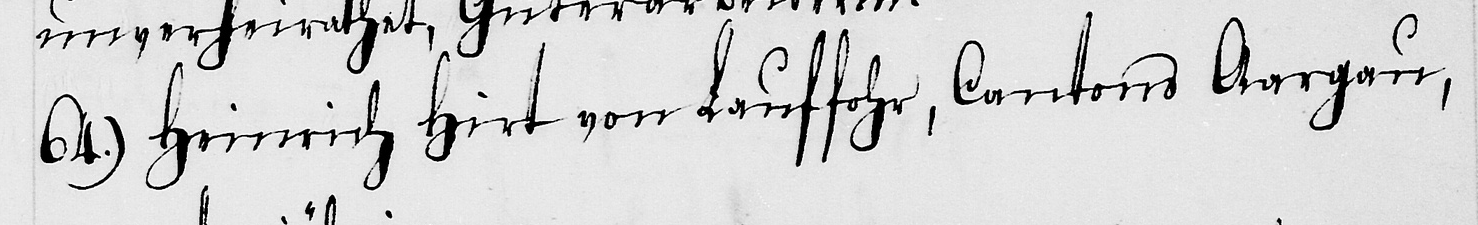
64.) Heinrich Hirt von Lauffohr, Cantons Aargau,
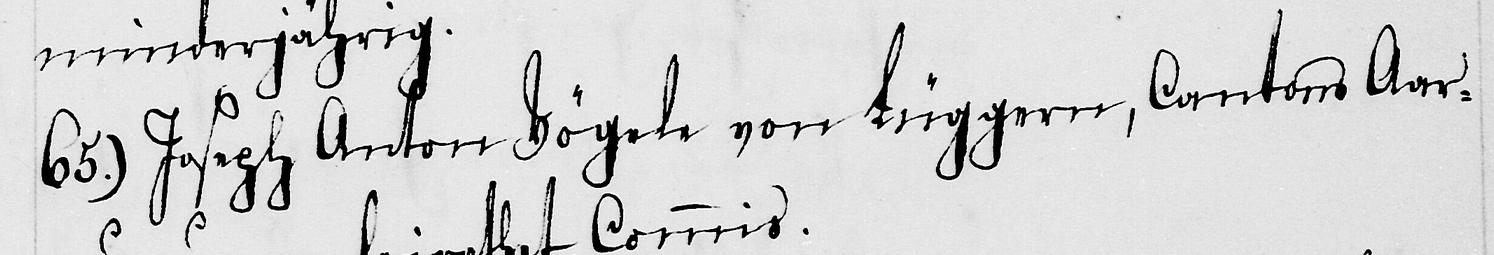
65.) Joseph Anton Vögele von Lüggern, Cantons Aar¬
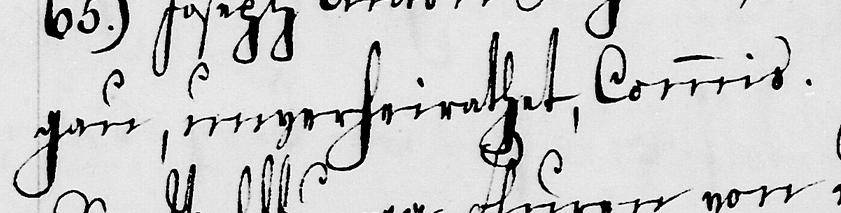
gau, unverheirathet, Commis.
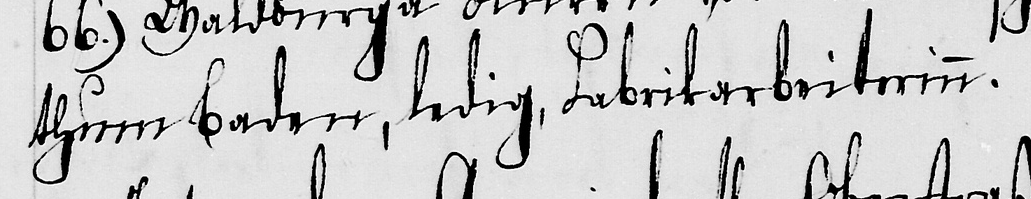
thum Baden, ledig, Fabrikarbeiterinn.
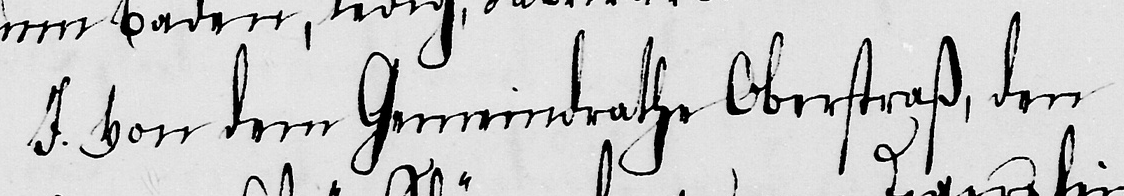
J. Von dem Gemeindrathe Oberstraß, den
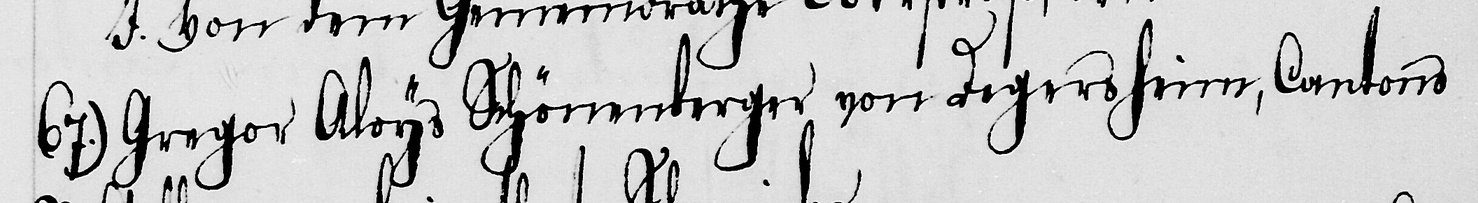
67.) Gregor Aloys Schönenberger von Degersheim, Cantons
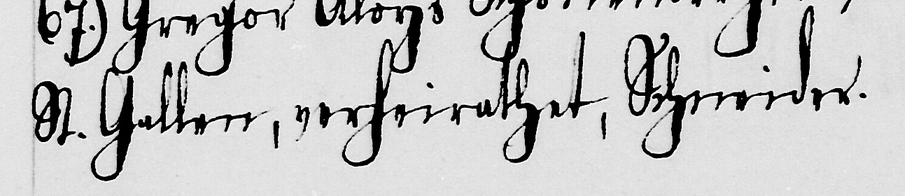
St. Gallen, verheirathet, Schneider.
